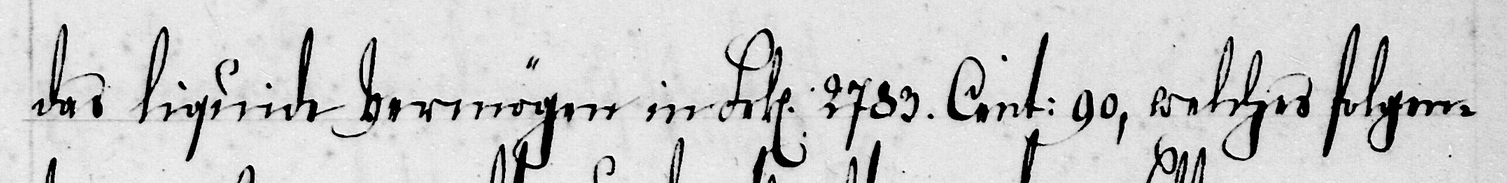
das liquide Vermögen in Frk[en]. 2783. Cent: 90, welches folgen¬
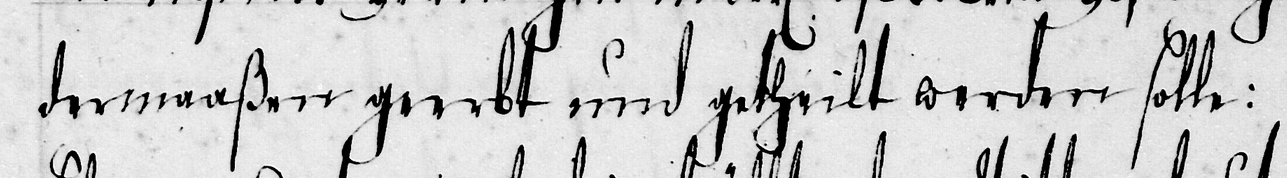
dermaßen geerbt und getheilt werden solle:
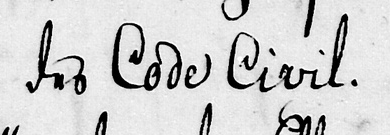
des Code Civil.
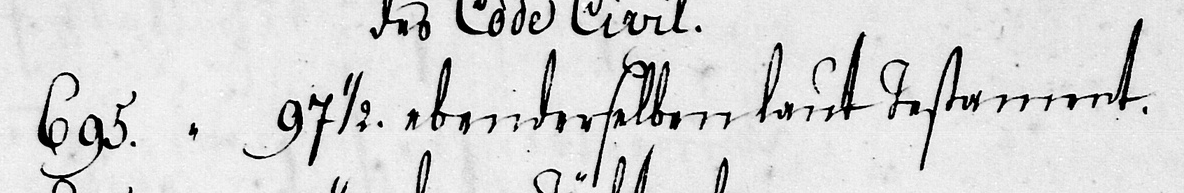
695. “ 971/2. ebenderselben laut Testament.
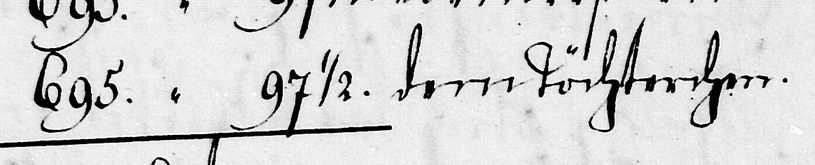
695. “ 971/2. dem Töchterchen.
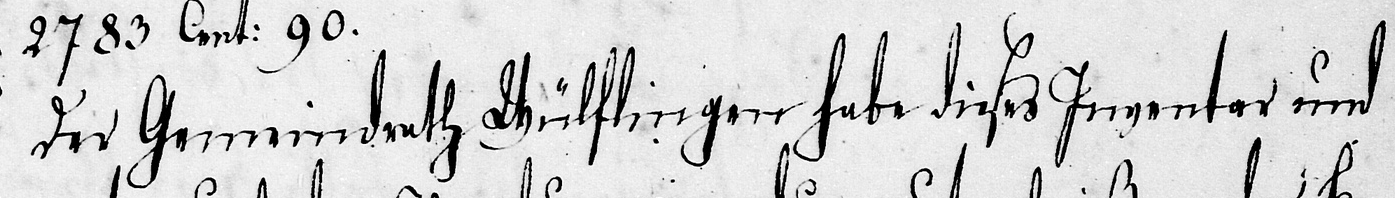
Der Gemeindrath Wülflingen habe dieses Inventar und
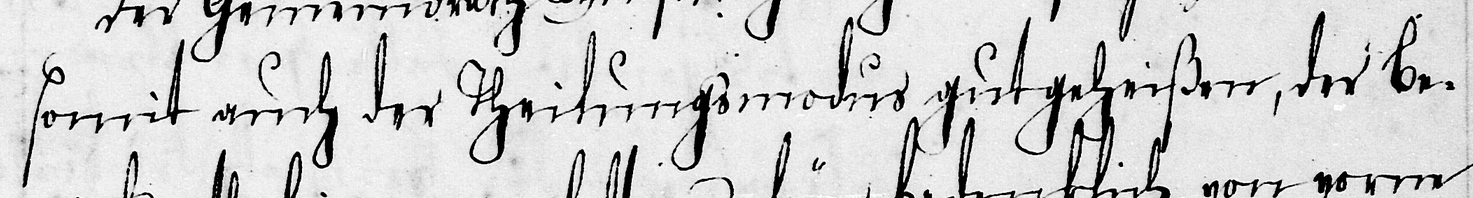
somit auch der Theilungsmodus gut geheißen, der Be¬
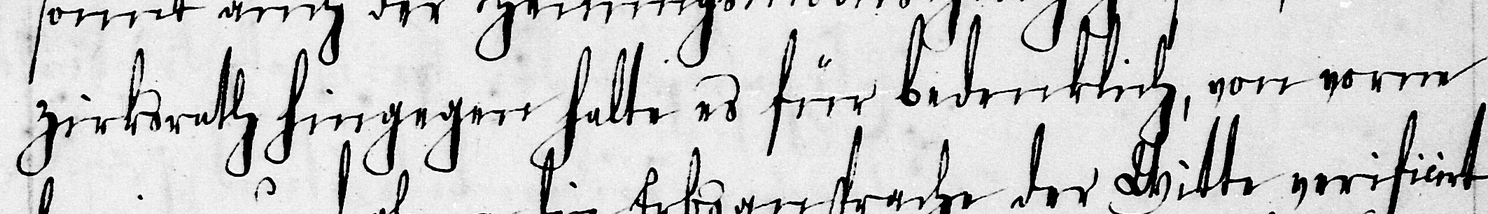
zirksrath hingegen halte es für bedenklich, von vorne
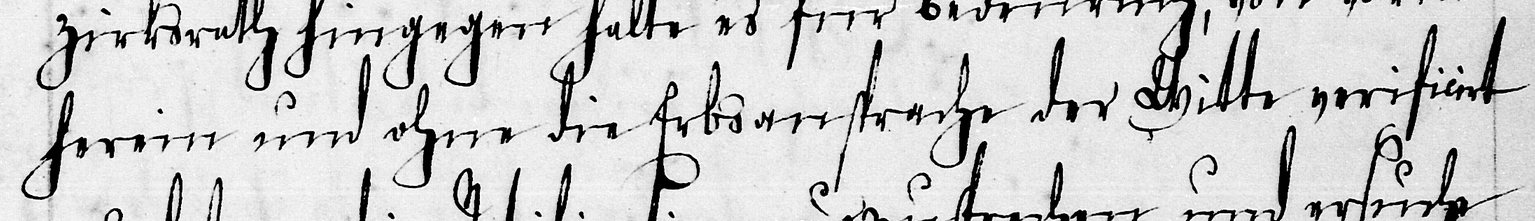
herein und ohne die Erbsansprache der Wittwe verificirt
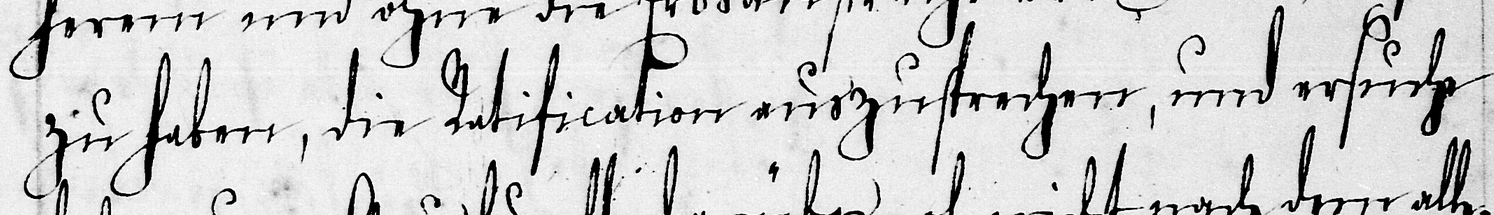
zu haben, die Ratification auszusprechen, und ersuche
